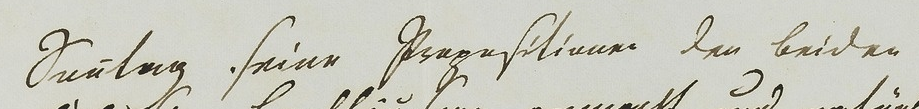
Sonntag seine Propositionen den beiden
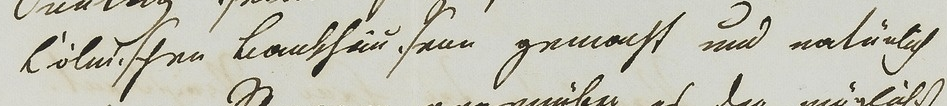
Cölnischen Bankhäusern gemacht und natürlich
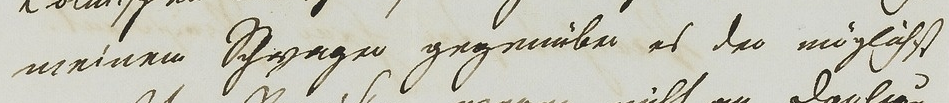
meinem Schwager gegenüber es der möglichst
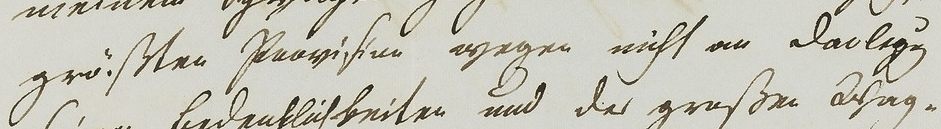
größten Provision wegen nicht an Darlegung
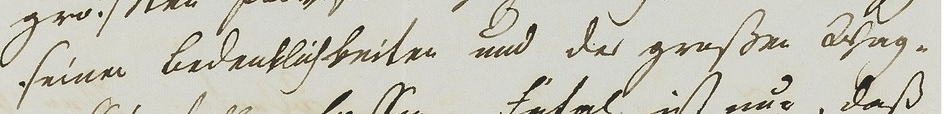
seiner Bedenklichkeiten und des großen Wag-
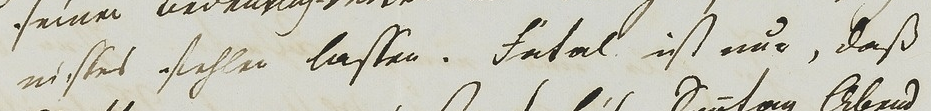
nisses fehlen lassen. Fatal ist nur, daß
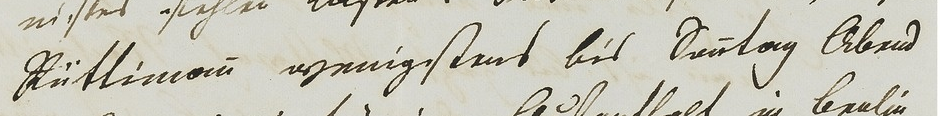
Rüttimann wenigstens bis Sonntag Abend
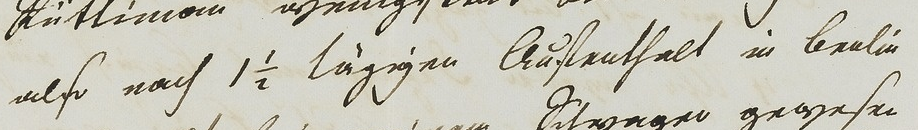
also nach 1½ tägigem Aufenthalt in Berlin
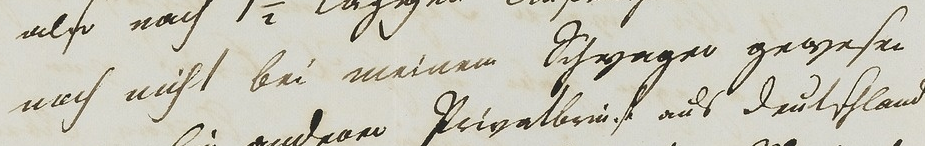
noch nicht bei meinem Schwager gewesen
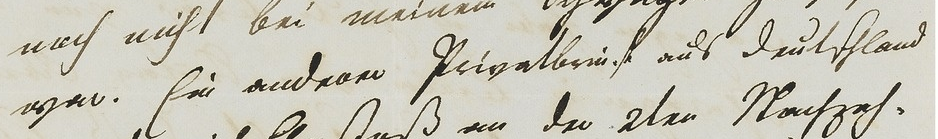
war. Ein anderer Privatbrief aus Deutschland
